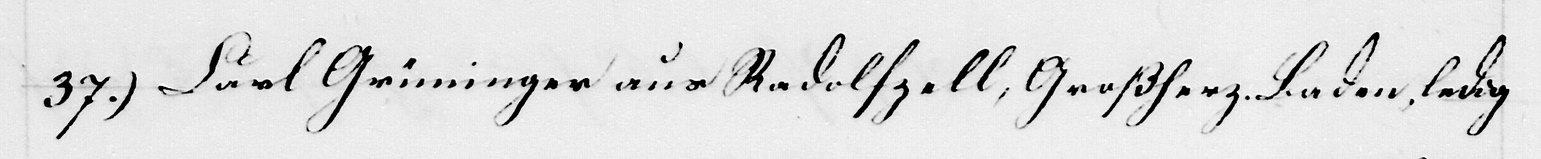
37.) Carl Grüninger aus Radolfzell, Großherz. Baden, ledig
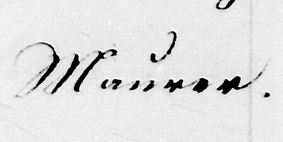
Maurer.
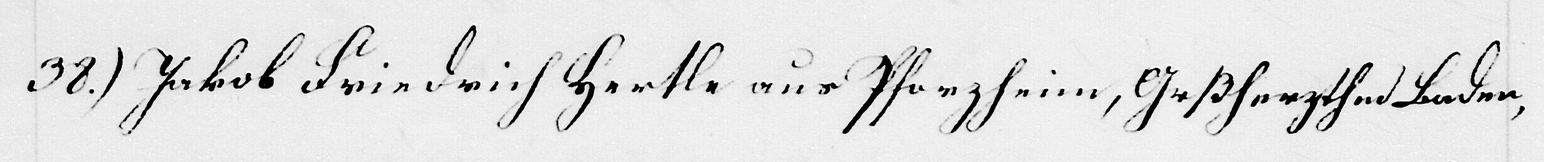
38.) Jakob Friedrich Hertle aus Pforzheim, Grßherzthm Baden,
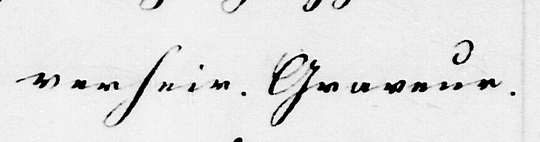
verheir. Graveur.
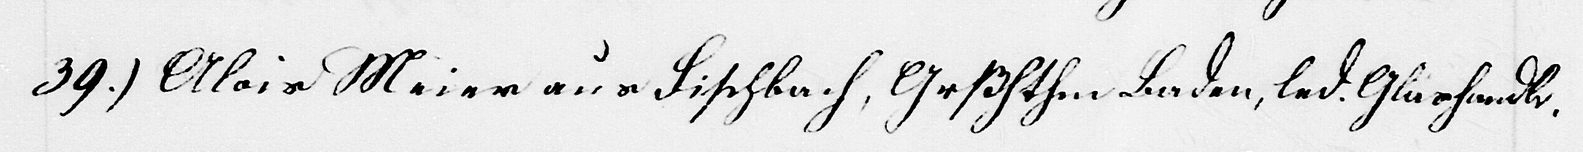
39.) Alois Meier aus Fischbach, Grßhthm Baden, led. Glashandw.
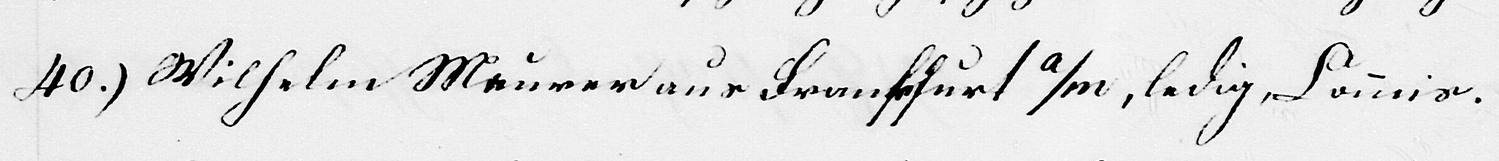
40.) Wilhelm Meurer aus Frankfurt a/m, ledig, Commis.
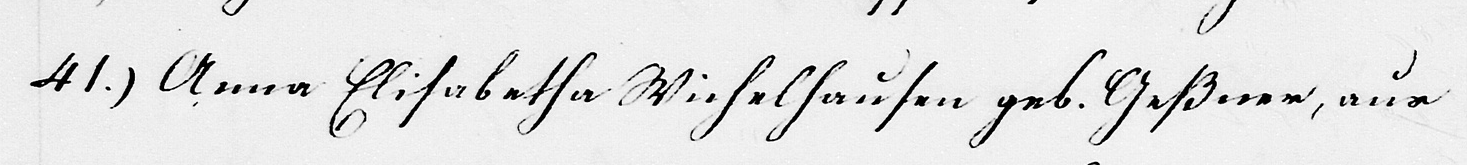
41.) Anna Elisabetha Wichelhausen geb. Geßner, aus
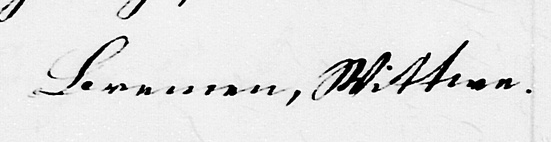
Loremen, Wittwe.
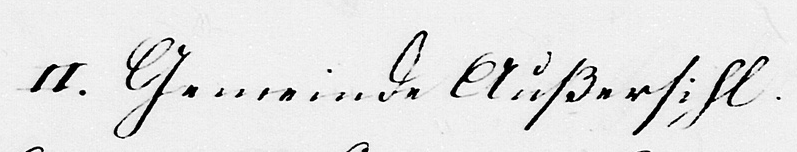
II. Gemeinde Außersihl.
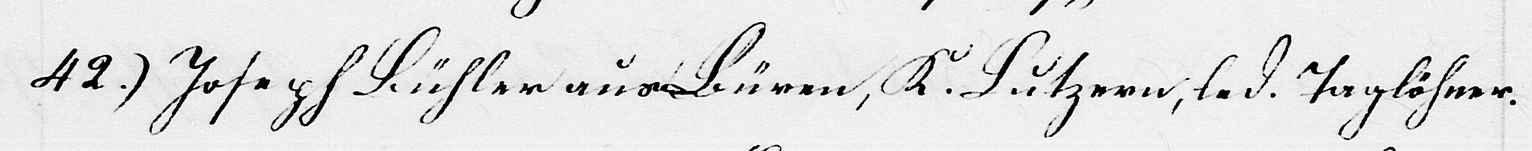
42.) Joseph Bühler aus Büren, K. Lutzern, led. Taglöhner.
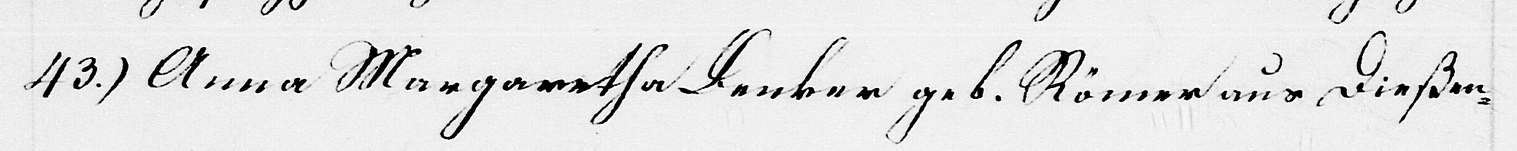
43.) Anna Margaretha Benker geb. Römer aus Dießen¬
